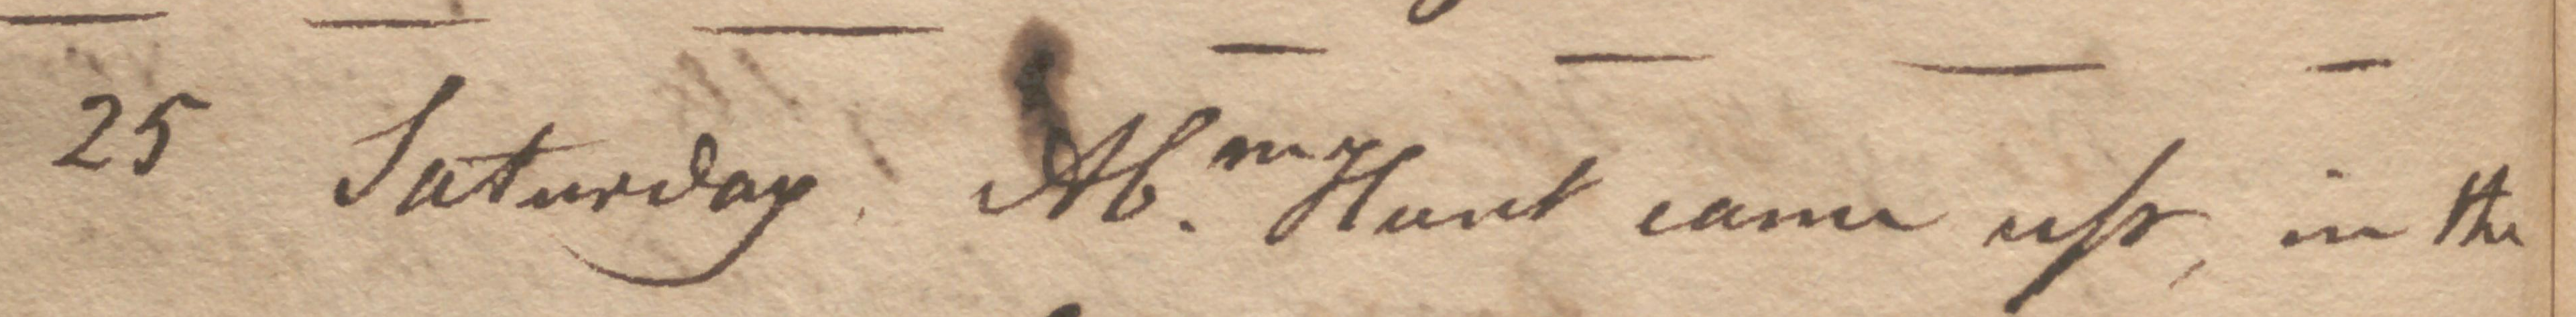25 Saturday. Ab^m. Hunt came up in the
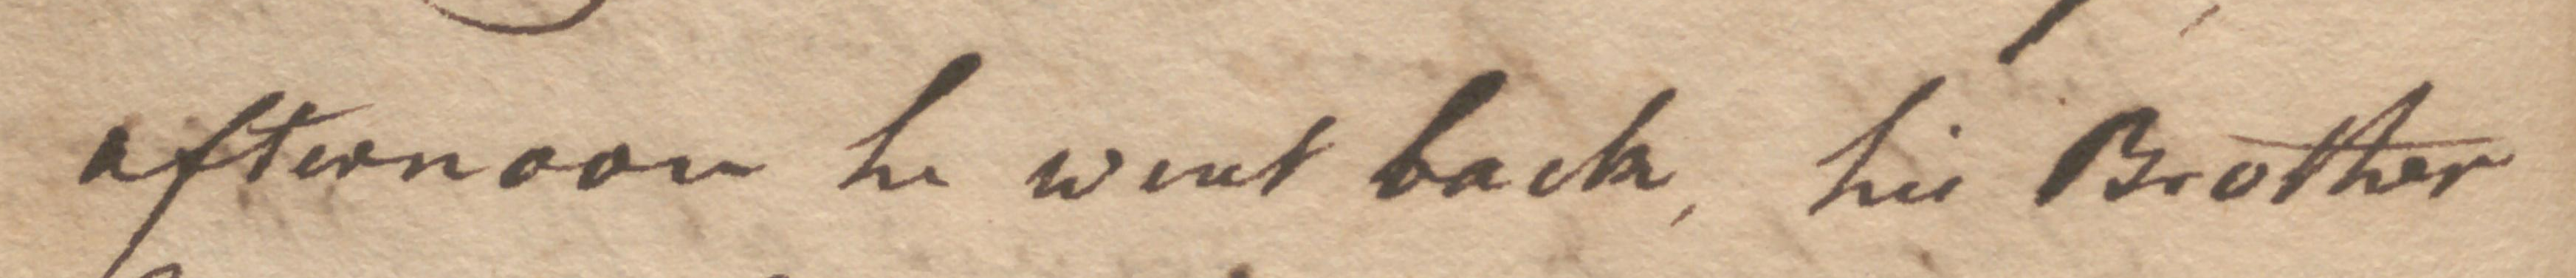afternoon he went back, his Brother
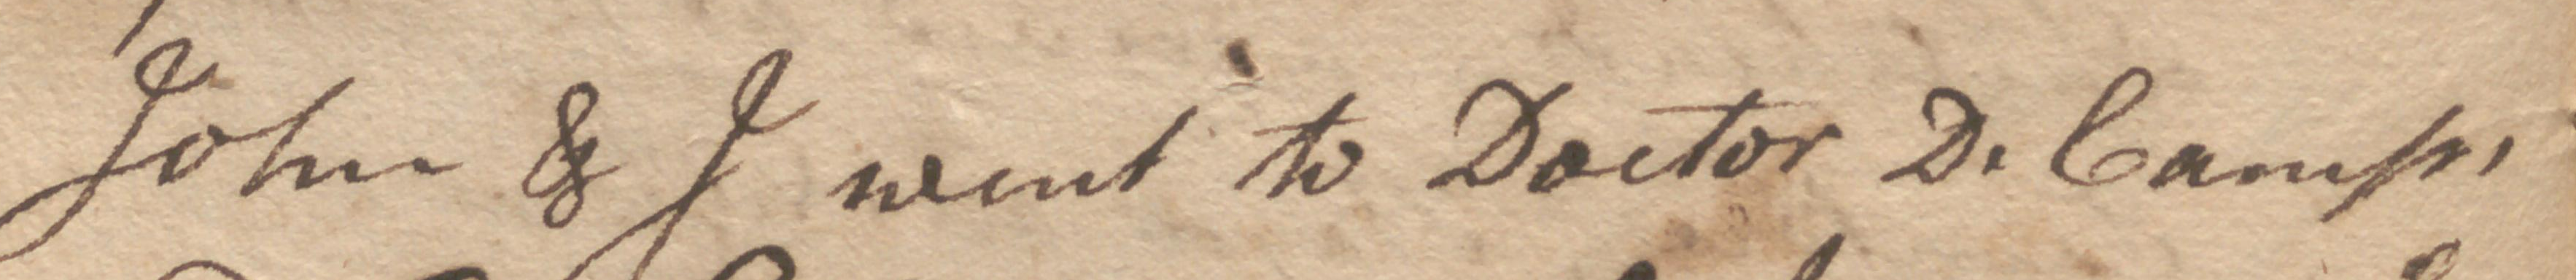John & I went to Doctor DeCamps
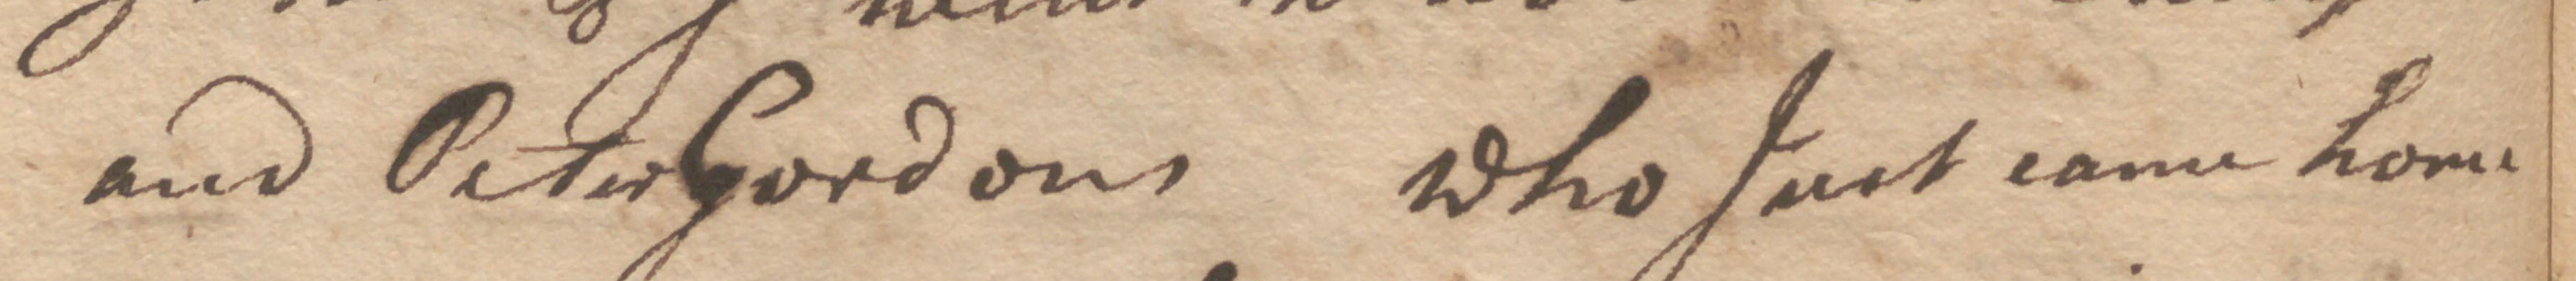and Peter Ggordons who Just came home
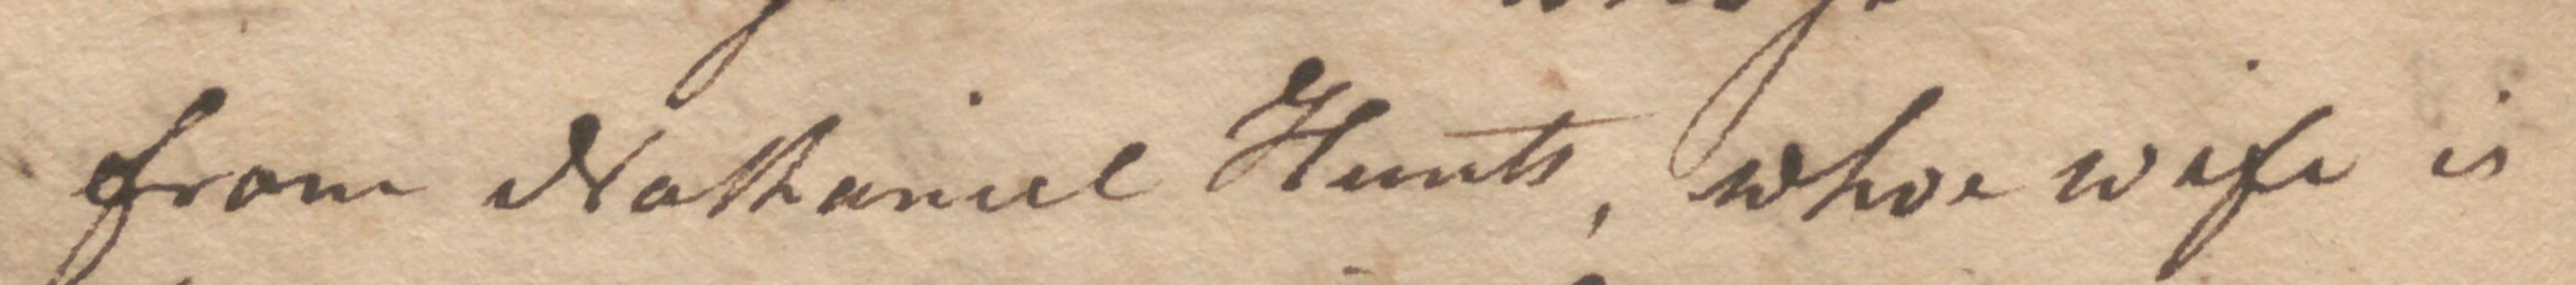from Nathaniel Hunts, whoe wife is
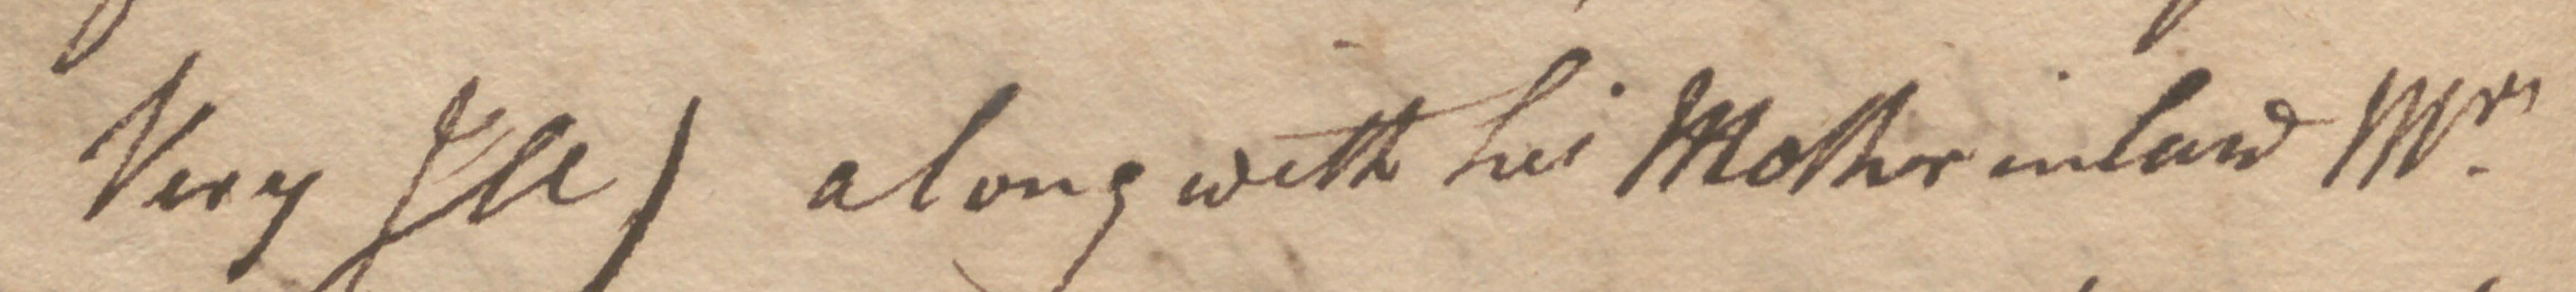Very Ill) along with his Mother inlaw M^r.
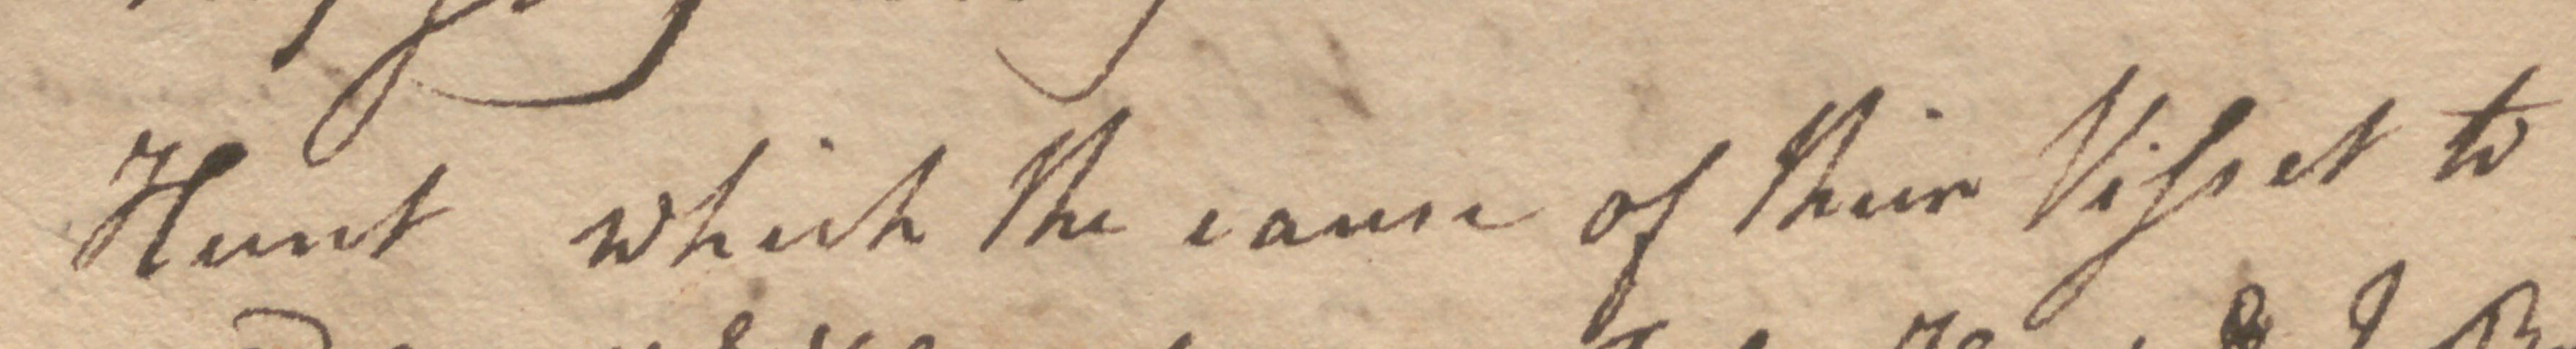Hunt which the cause of their Visset to
